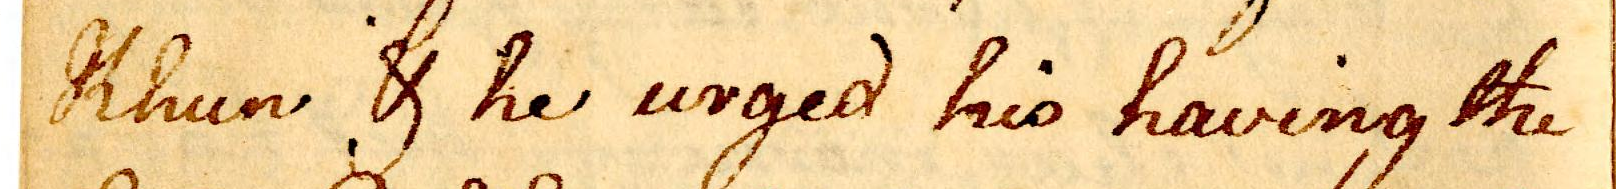Khun & he urged his having the
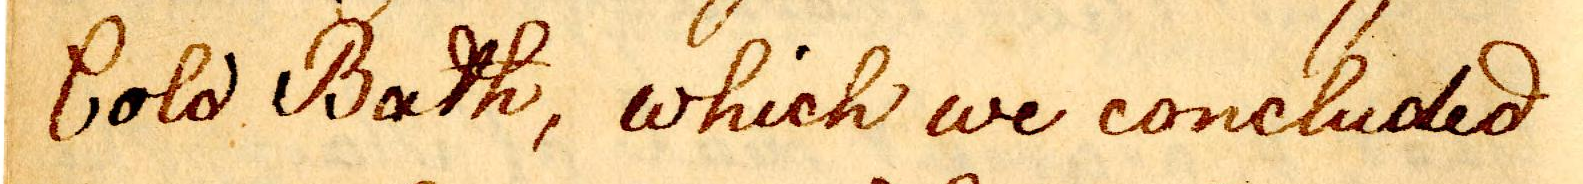Cold Bath, which we concluded
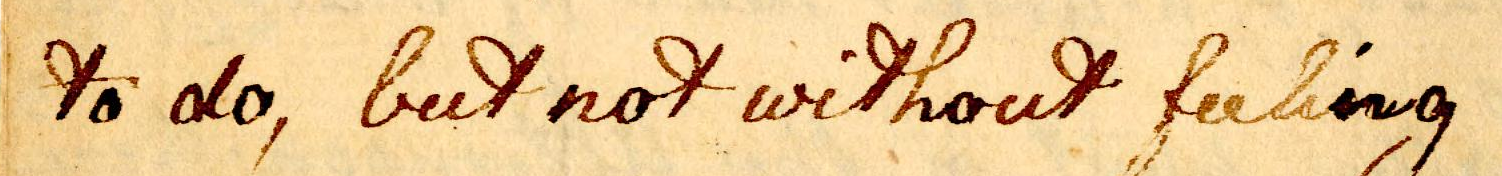to do, but not without feeling
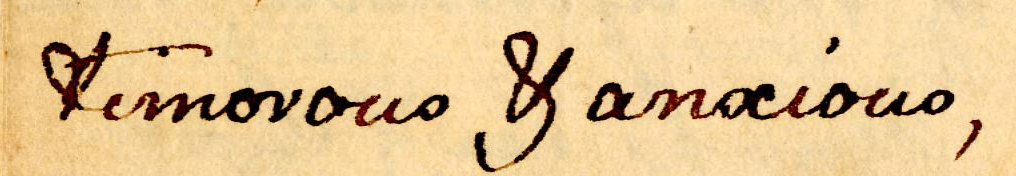timorous & anxious,
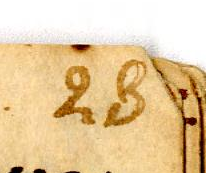23
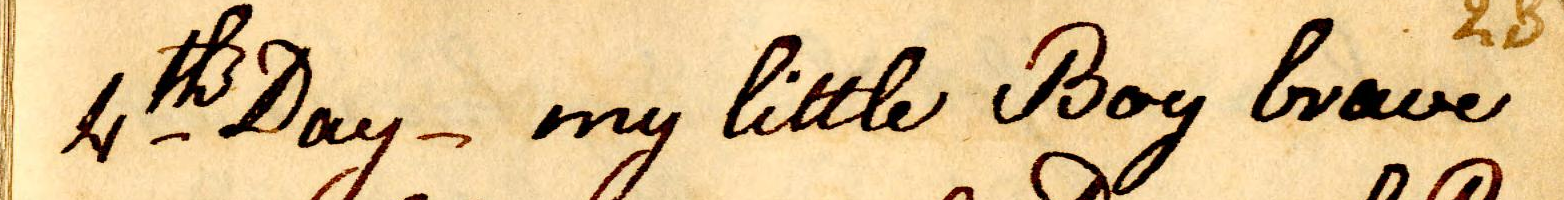4^th Day- my little Boy brave
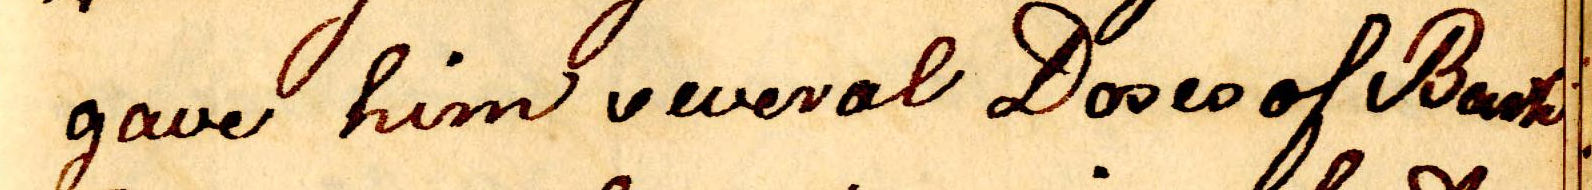gave him several Doses of Bark
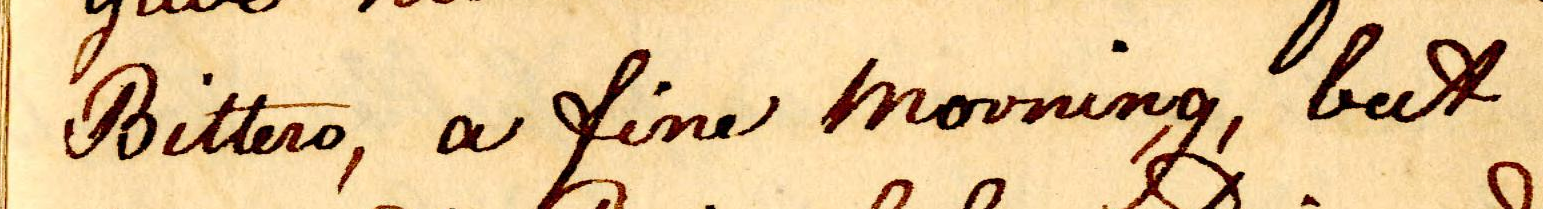Bitters, a fine Morning, but
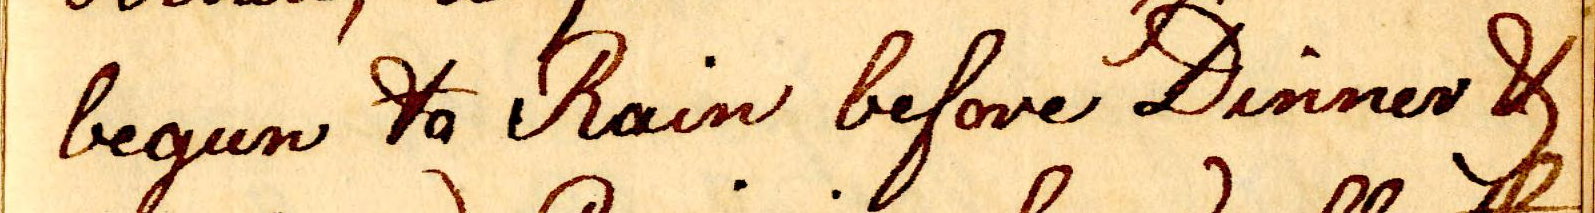begun to Rain before Dinner &
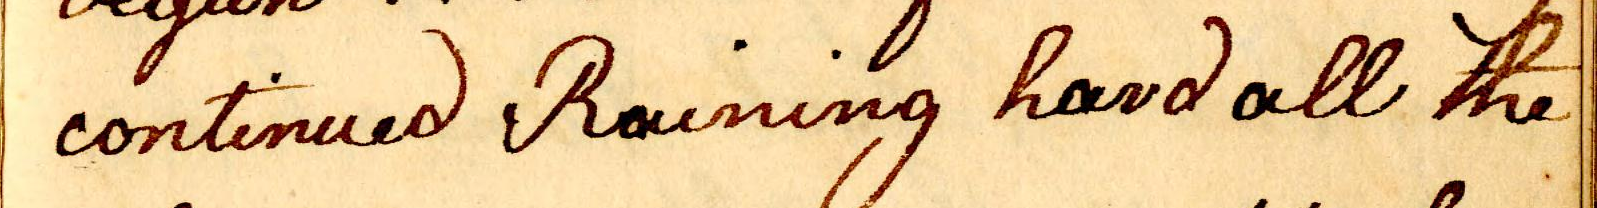continued Raining hard all the
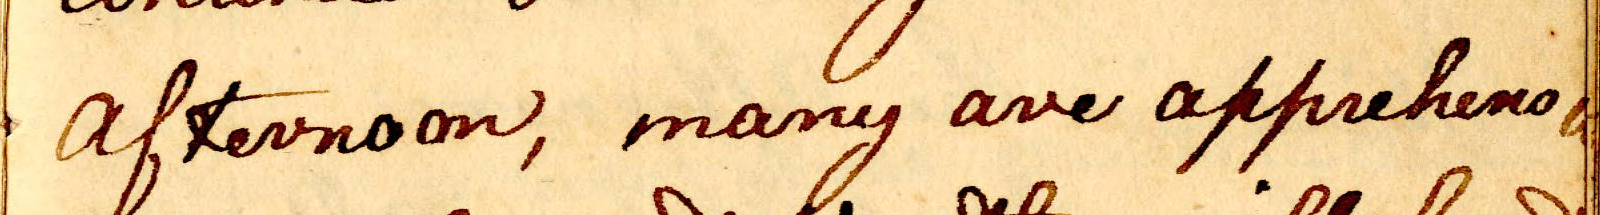Afternoon, many are apprehens
